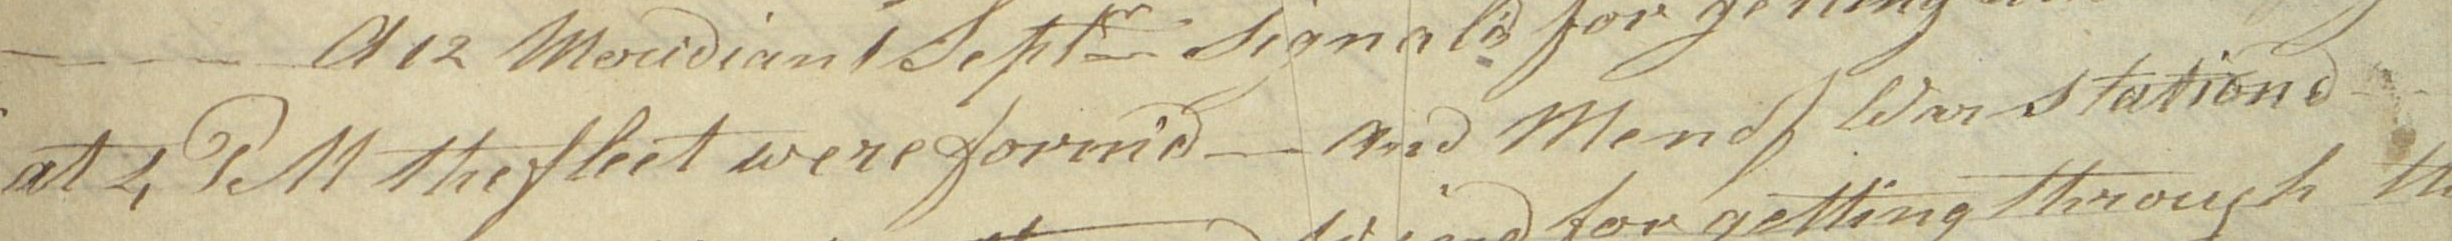at 4 PM the fleet were form'd and Men of War Stationd
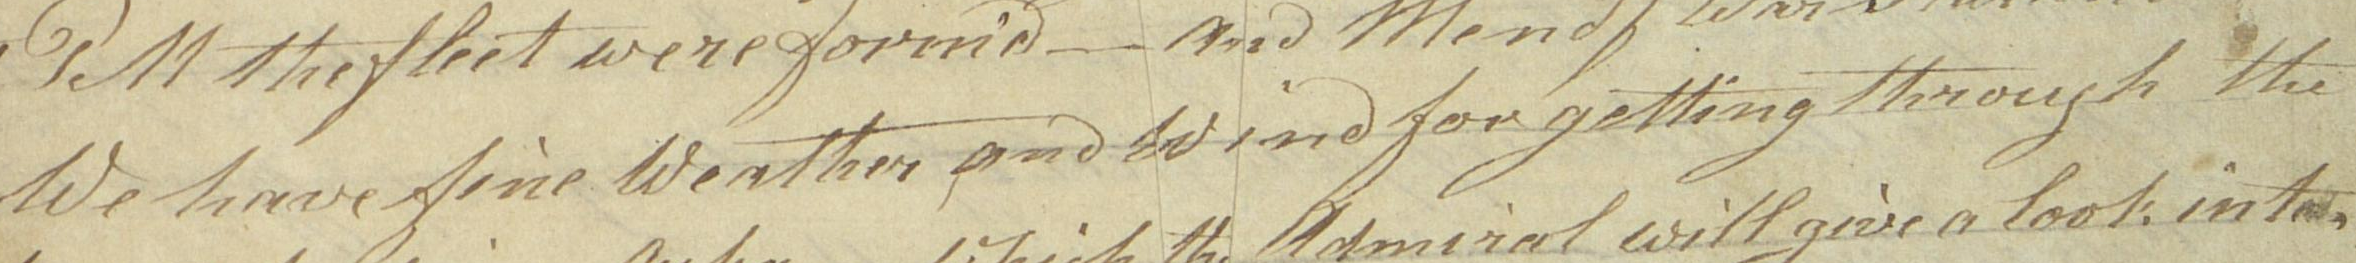We have fine Weather and wind for getting through the
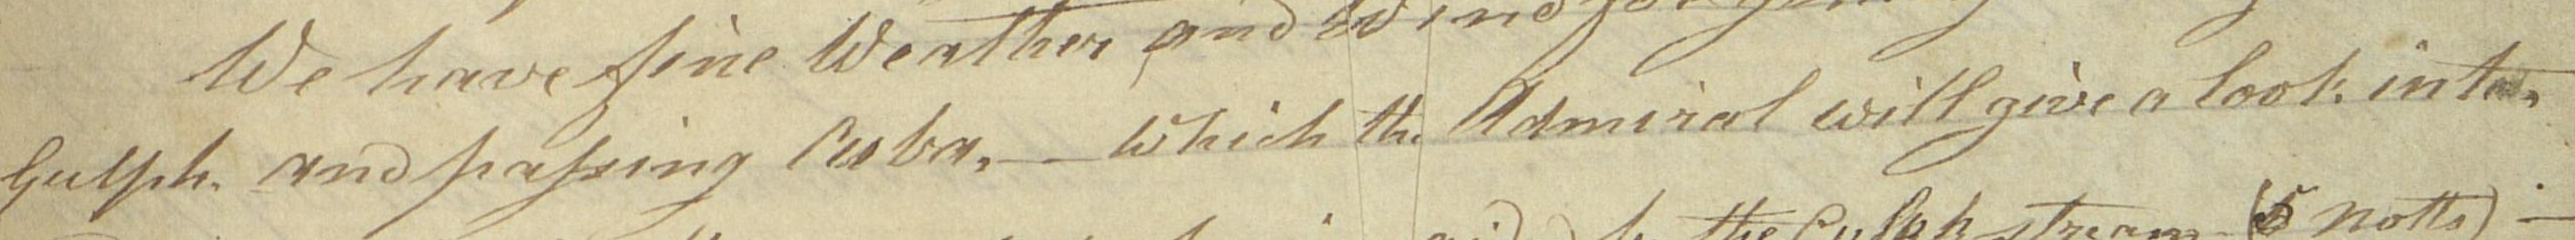Gulph, and passing Cuba. which the Admiral will give a look into
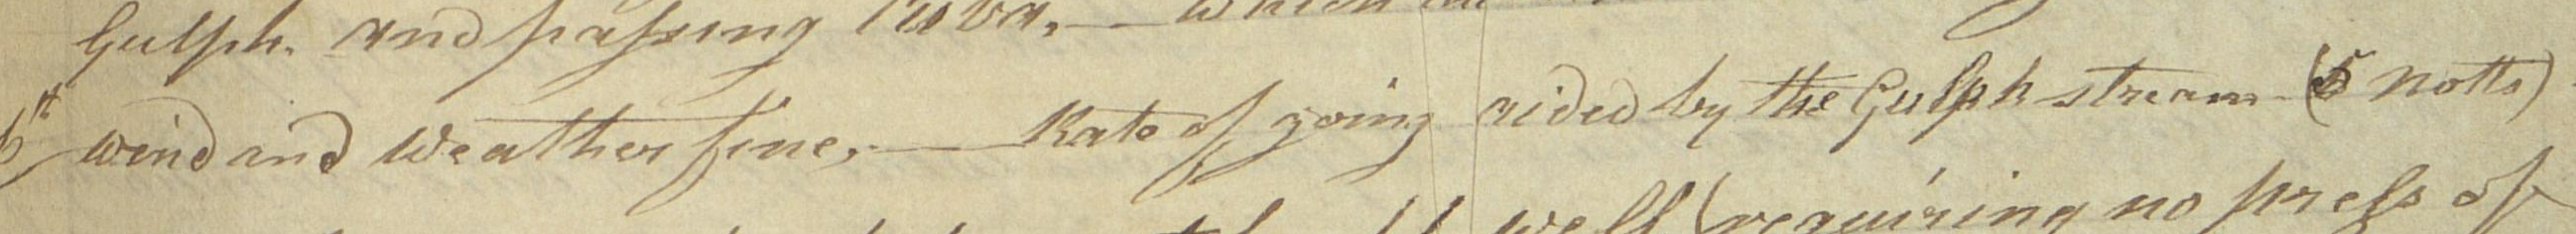6^th wind and Weather fine, Rate of going aided by the Gulph stream (5 notts)
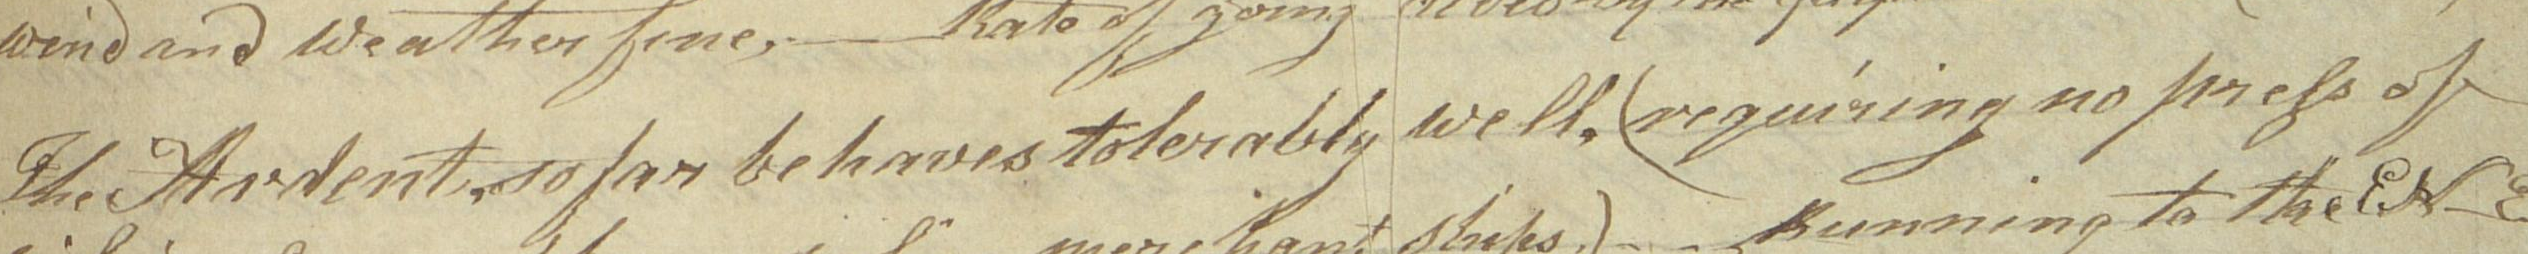The Ardent, so far behaves tolerably well, (requiring no press of
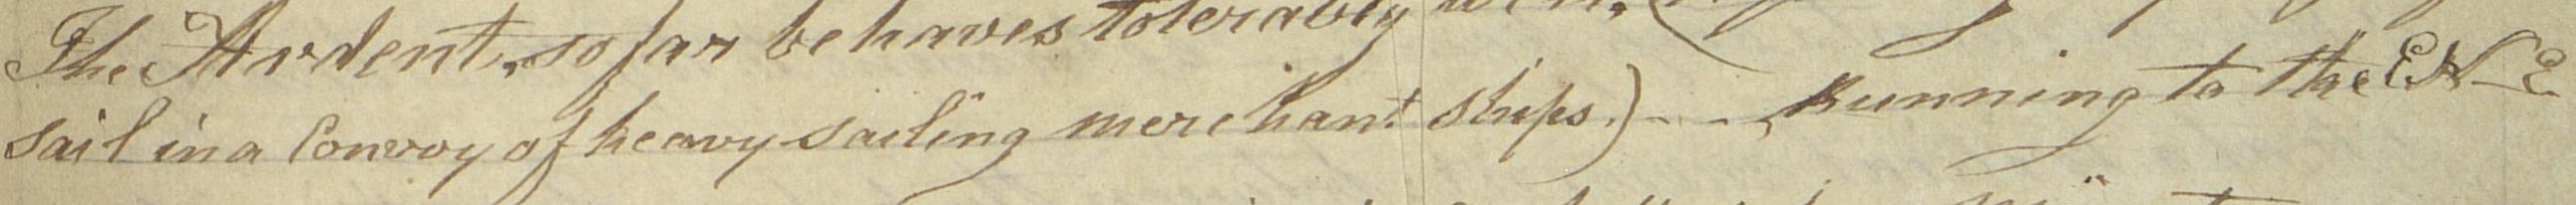sail in a Convoy of heavy sailing merchant ships) Running to the ENE
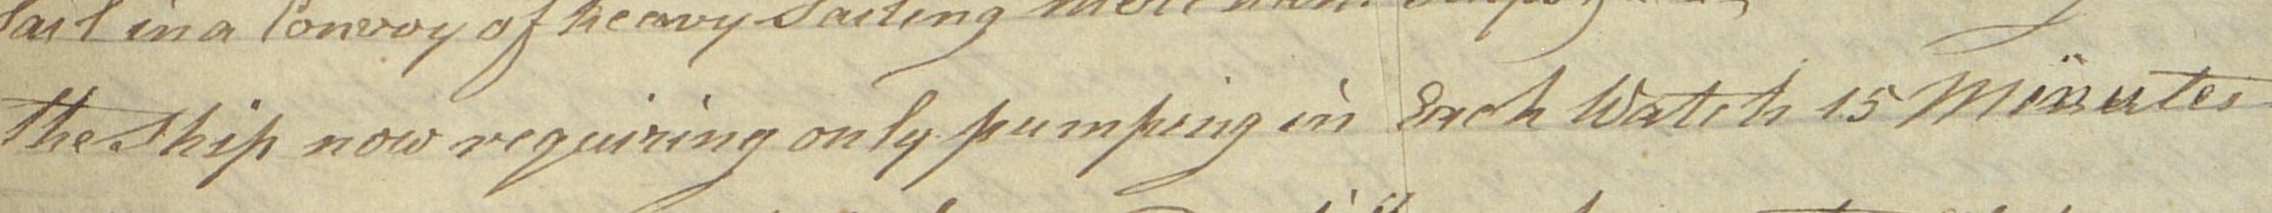The Ship now requiring only pumping in each Watch 15 Minutes
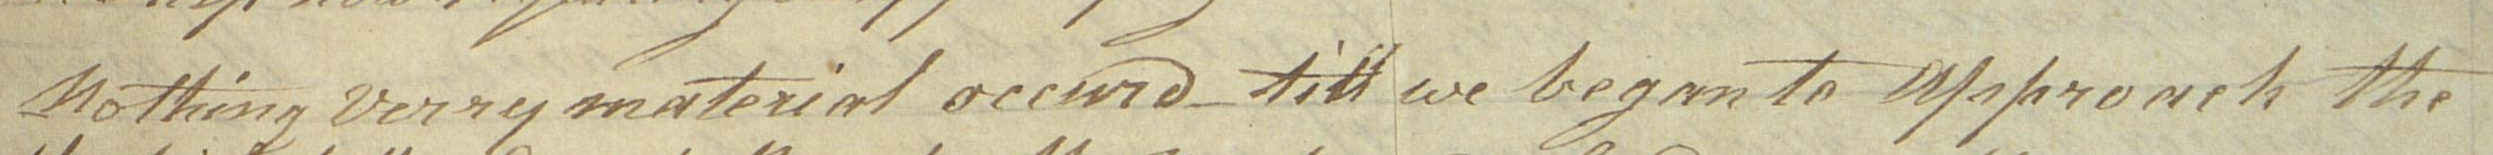Nothing verry material occurd till we began to approach the
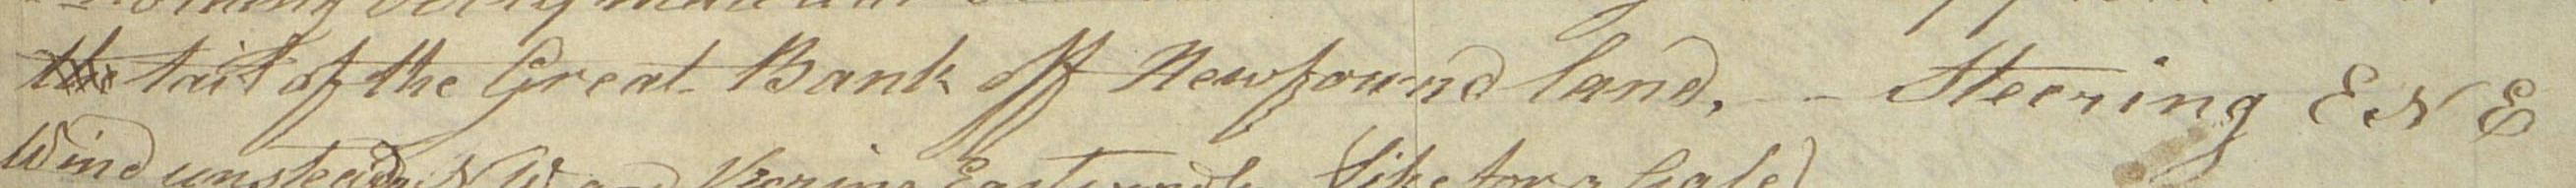the tail of the Great Bank off Newfound land. Steering ENE
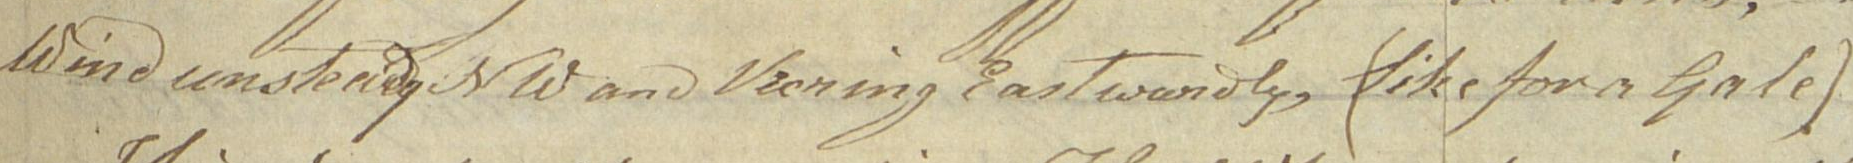Wind unsteady NW and Veering Eastwardly (like for a Gale)
